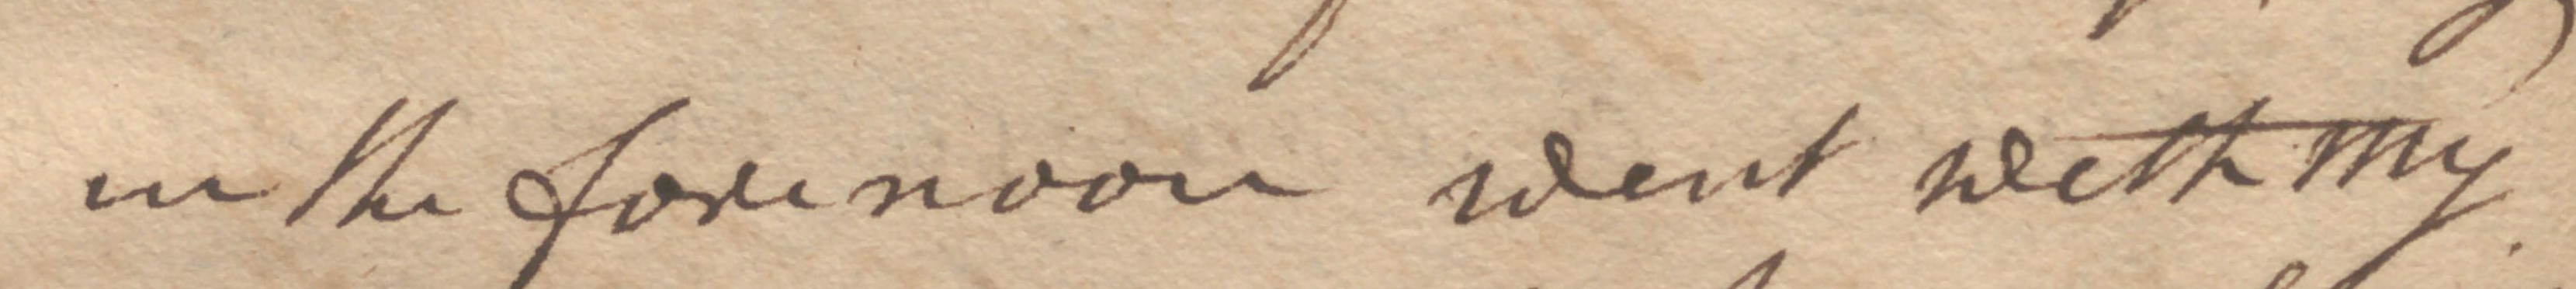in the forenoon went with My
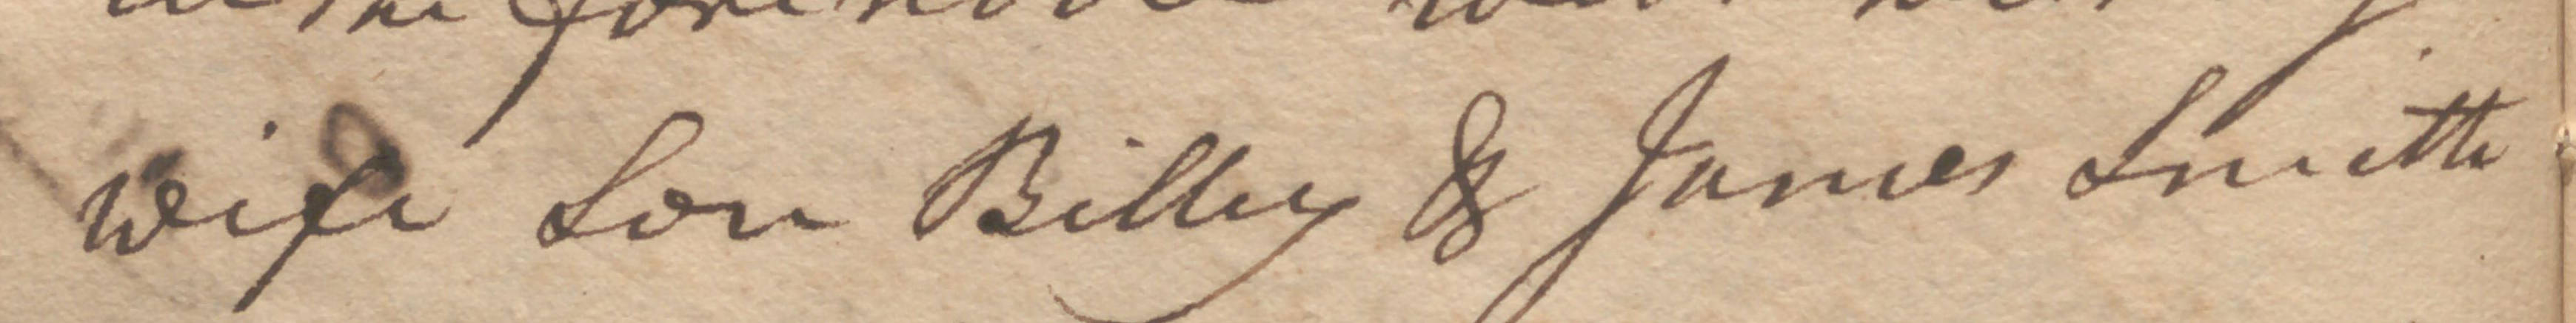wife Son Billey & James Smith
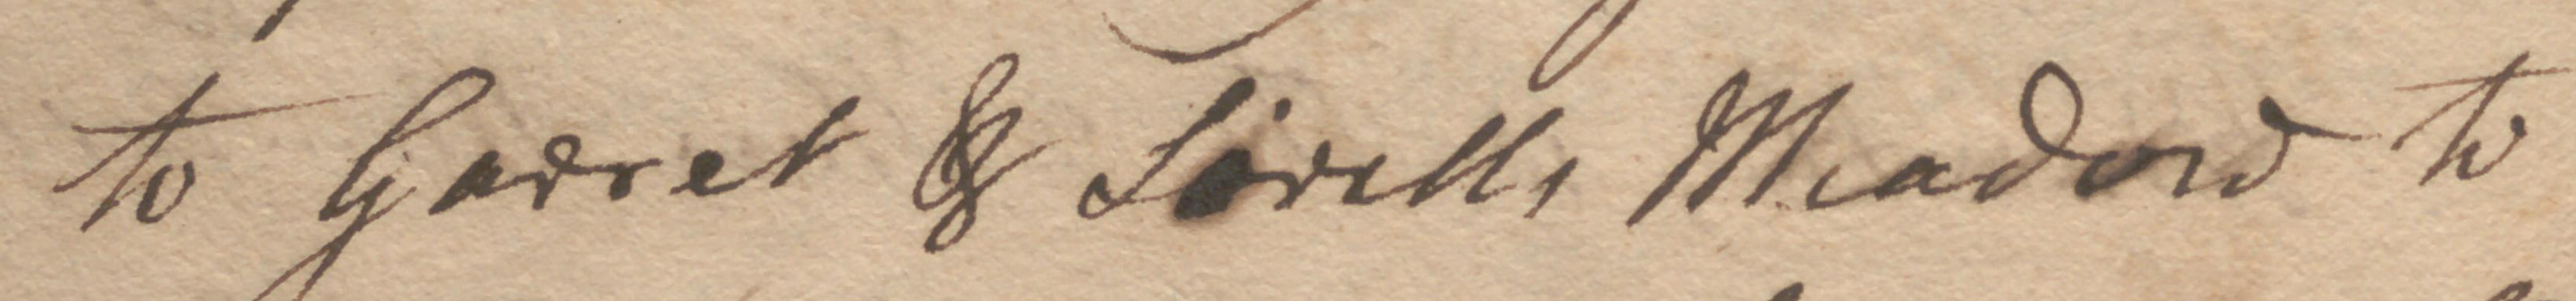to Garret & Sirells Meadow to
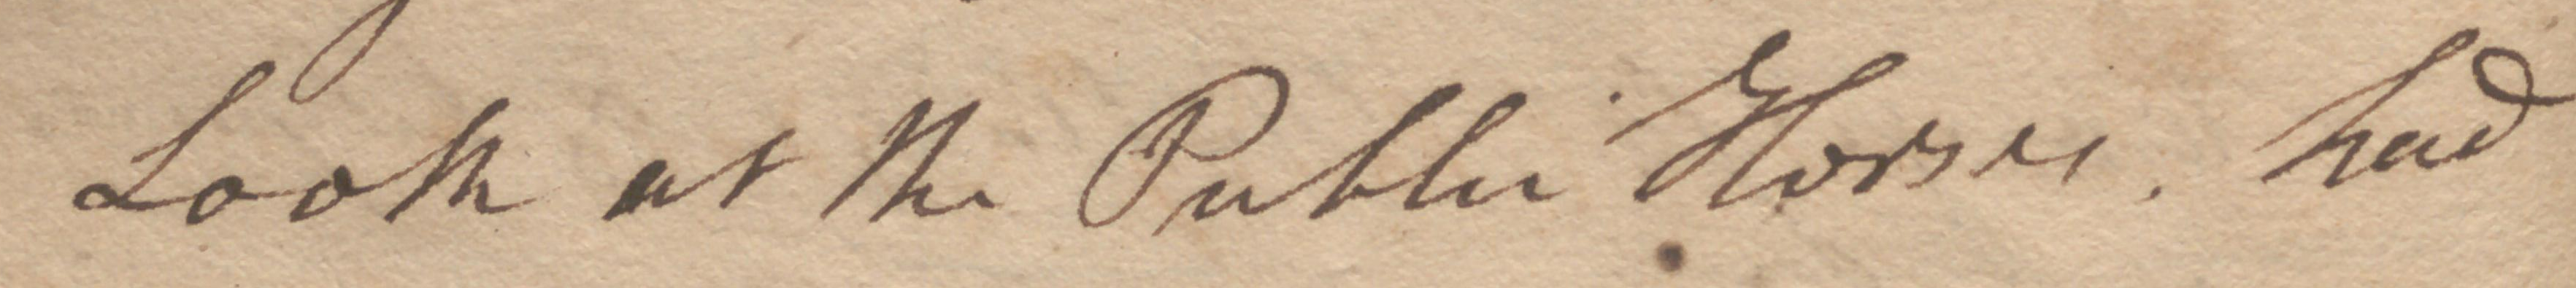Look at the Public Horses, had
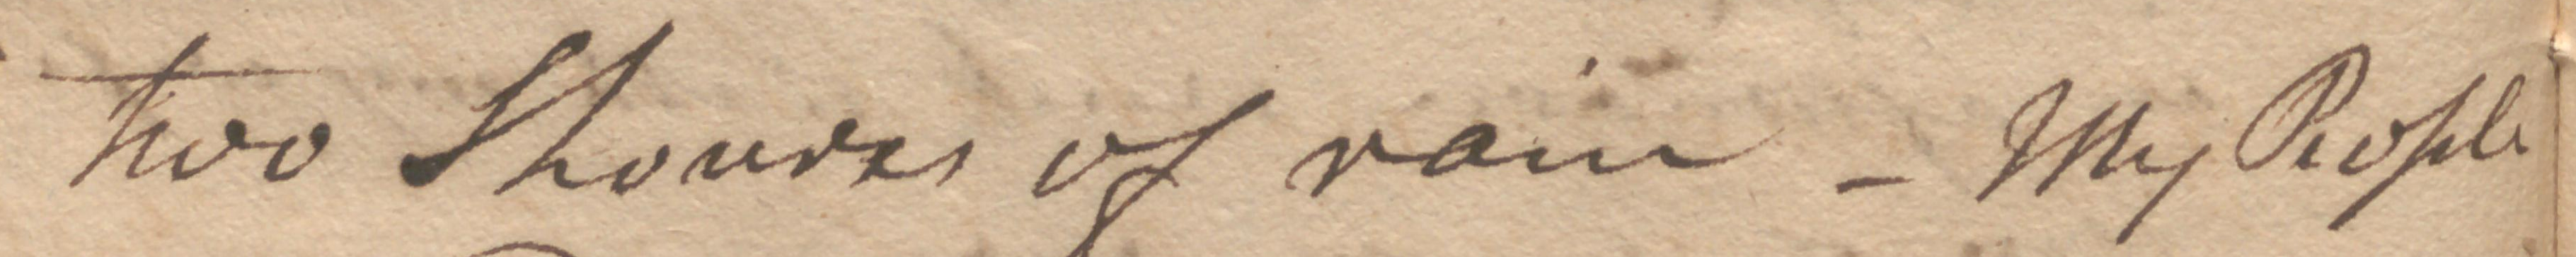two Shoures of rain- My People
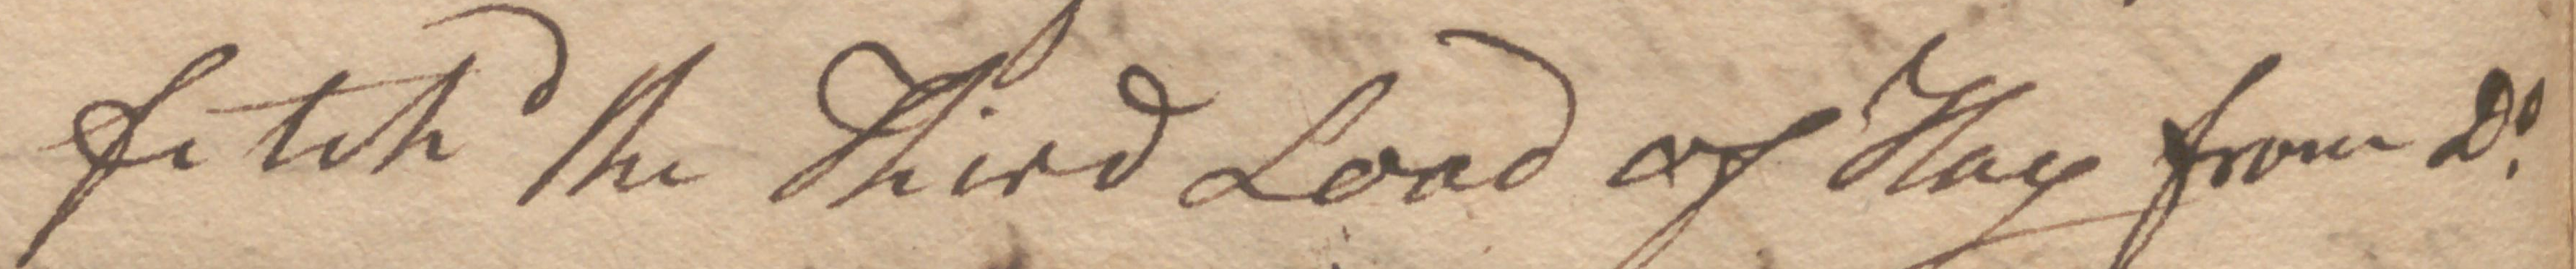fetch the third Load of Hay from D^o.
